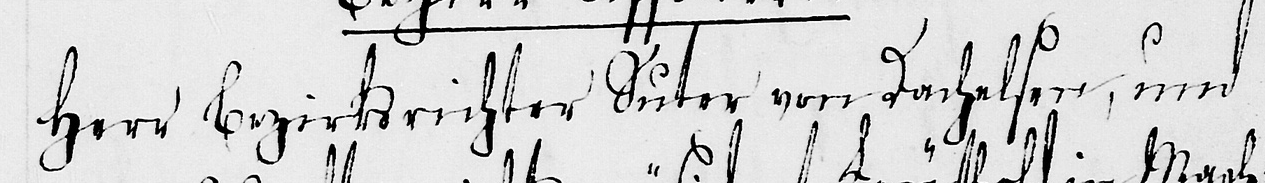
Herr Bezirksrichter Suter von Dachelsen, und
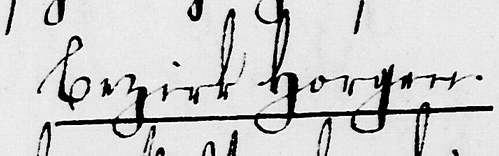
Bezirk Horgen.
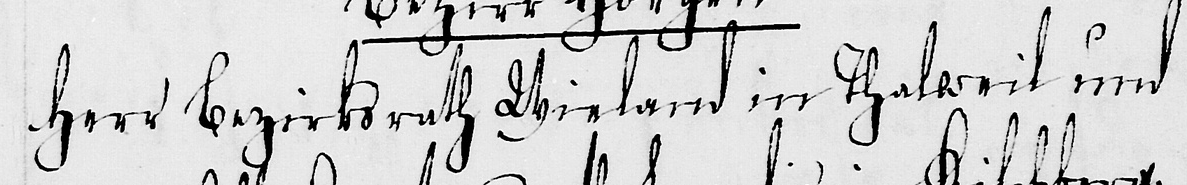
Herr Bezirksrath Wieland in Thalweil und
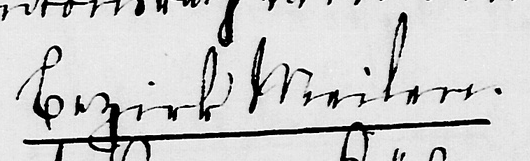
Bezirk Meilen.
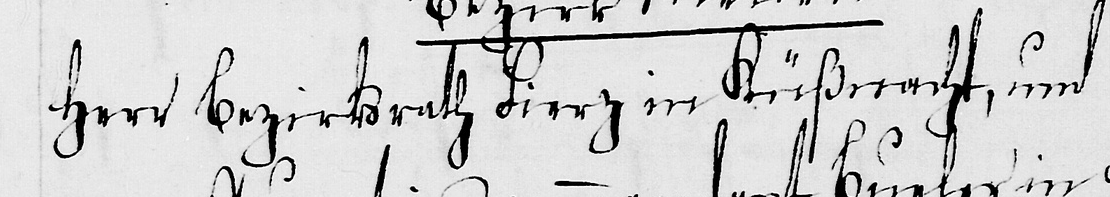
Herr Bezirksrath Fierz in Küßnacht, und
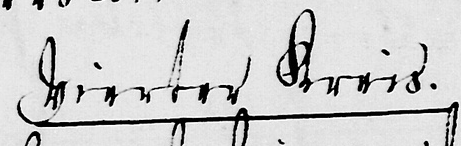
Vierter Kreis.
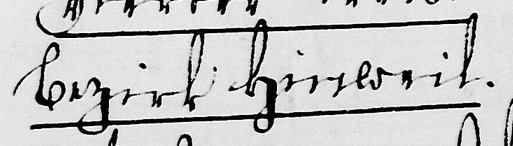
Bezirk Hinweil.
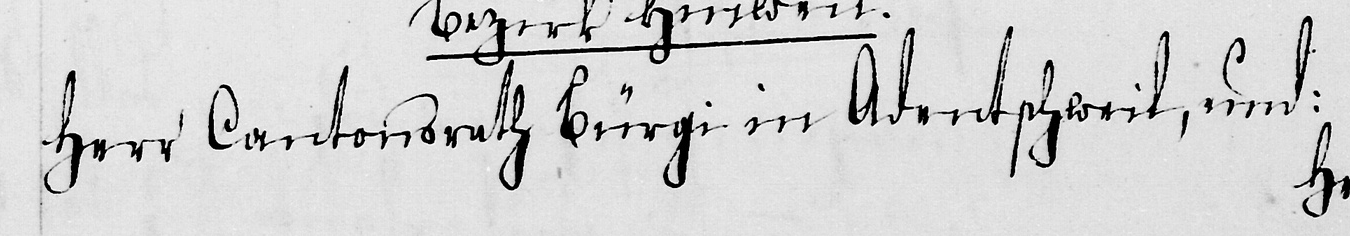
Herr Cantonsrath Bürgi in Adentschweil, und:
